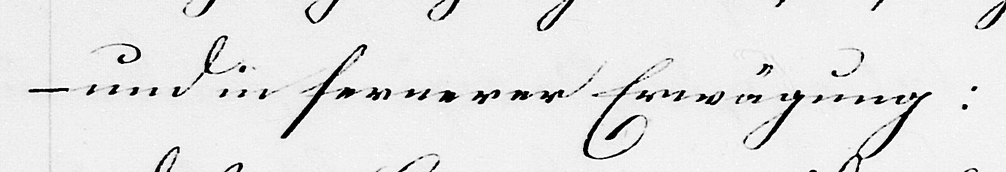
und in fernerer Erwägung:
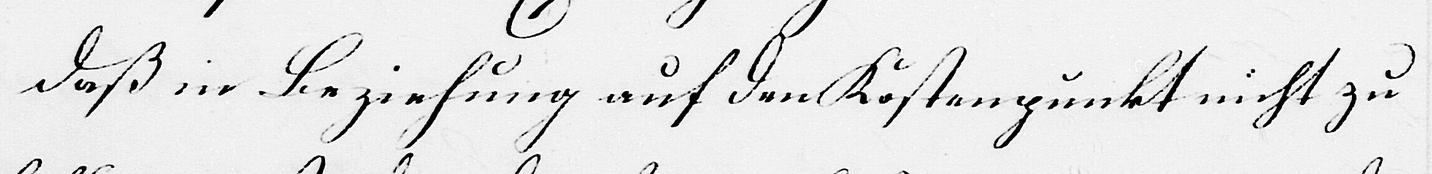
Daß in Beziehung auf den Kostenpunkt nicht zu
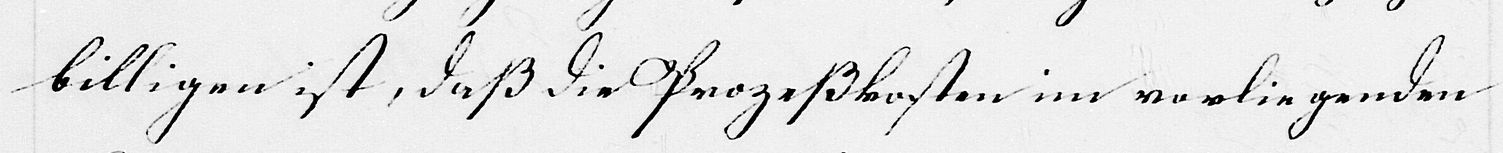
billigen ist, daß die Prozeßkosten im vorliegenden
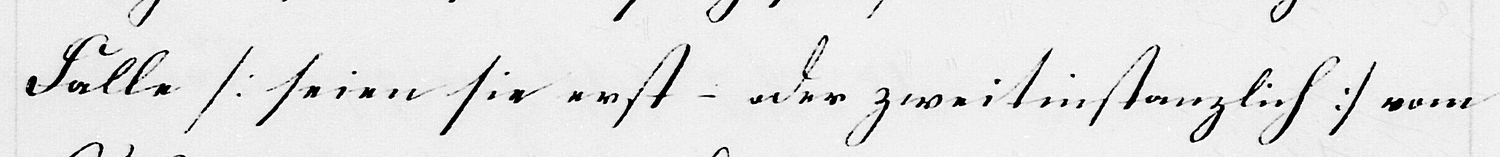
Falle [seien sie erst- oder zweitinstanzlich] vom
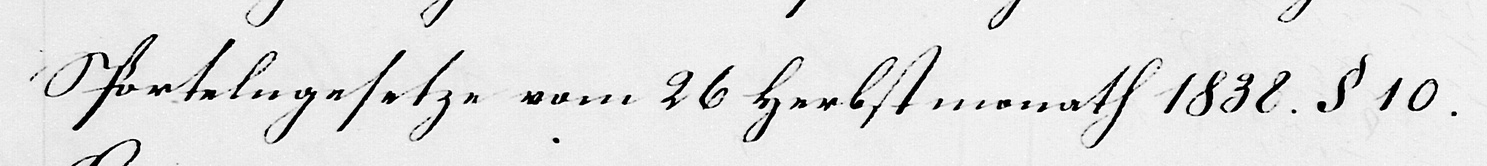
Sportelngesetze vom 26 Herbstmonath 1838. § 10.
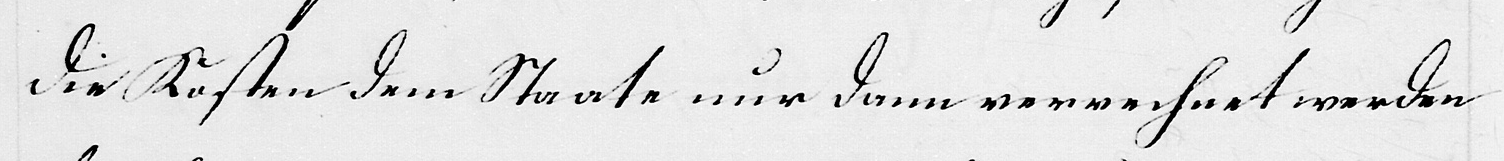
die Kosten dem Staate nur dann verrechnet werden
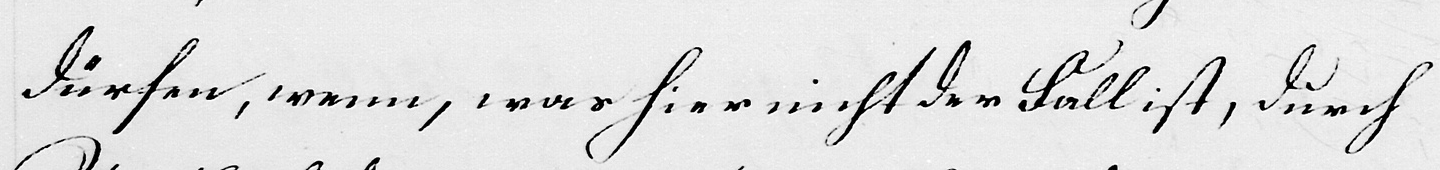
dürfen, wenn, was hier nicht der Fall ist, durch
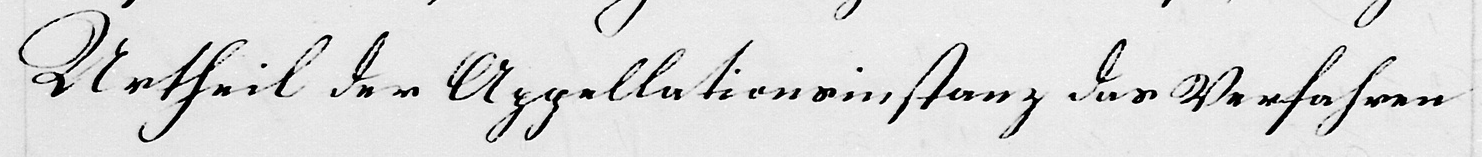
Urtheil der Appellationsinstanz das Verfahren
